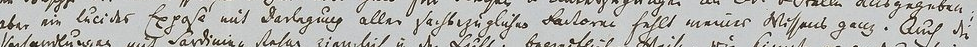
aber ein lucides Exposé mit Darlegung aller sachbezüglichen Factoren fehlt meines Wissens ganz. Auch die
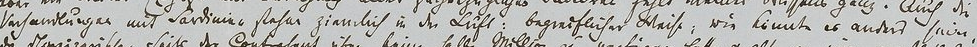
Verhandlungen mit Sardinien stehen ziemlich in der Luft: begreiflicher Weise; wie könnte es anders sein,
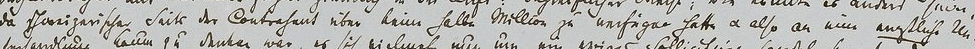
da schweizerischer Seits der Contrahent über keine halbe Million zu verfügen hatte & also an eine ernstliche Un-
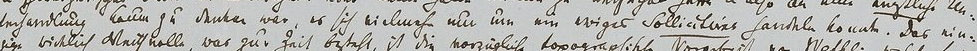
terhandlung kaum zu denken war, es sich vielmehr nur um ein ewiges Sollicitairs handeln konnte. Das ein-
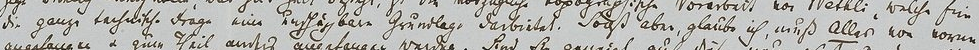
die ganze technisch. Frage eine unschätzbare Grundlage darbietet. Sonst aber, glaube ich, muß Alles von vorne
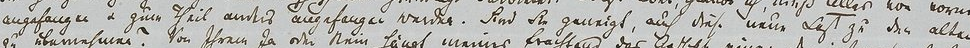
angefangen & zum Theil anders angefangen werden. Sind Sie geneigt, auch diese neue Last zu den alten
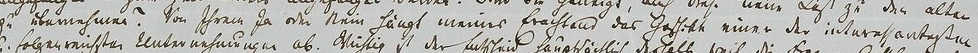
zu übernehmen? Von Ihrem Ja oder Nein hängt meines Erachtens das Geschikk einer der interessantesten
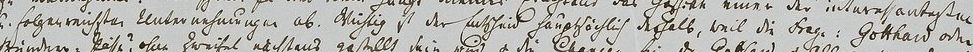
u. folgenreichsten Unternehmungen ab. Wichtig ist der Entscheid hauptsächlich deshalb, weil die Frage: Gotthard oder
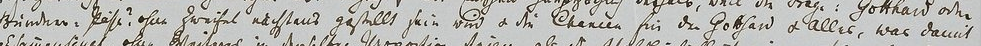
Bündner-Pässe? ohne Zweifel nächstens gestellt sein wird & die Chancen für den Gotthard & Alles, was damit
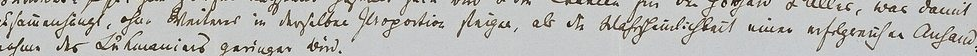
zusammenhängt, ohne Weiteres in derselben Proportion steigen, als die Wahrscheinlichkeit einer erfolgreichen Anhand-
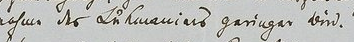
nahme des Lukmaniers geringer wird.
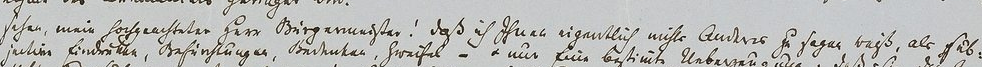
sehen, mein hochgeachteter Herr Bürgermeister! daß ich Ihnen eigentlich nichts Anderes zu sagen weiß, als sub-
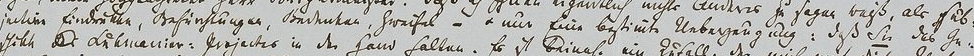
jective Eindrükke, Befürchtungen, Bedenken, Zweifel – & nur Eine bestimmte Ueberzeugung: daß Sie das Ge-
